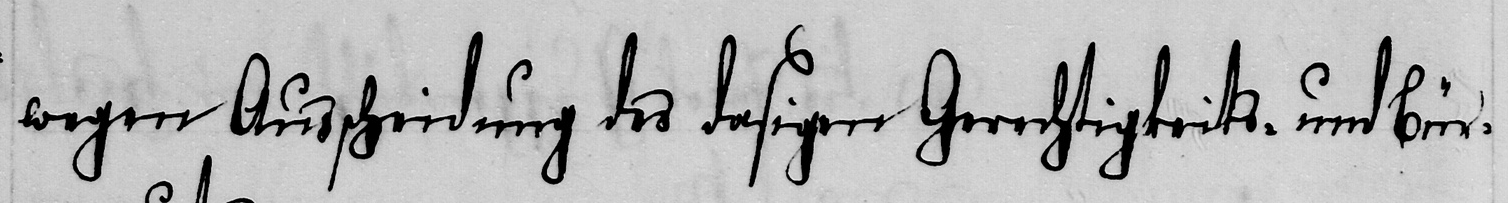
wegen Ausscheidung des dasigen Gerechtigkeits- und Bür¬
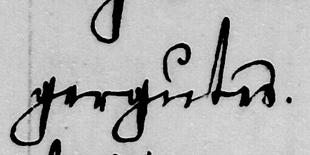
gergutes.
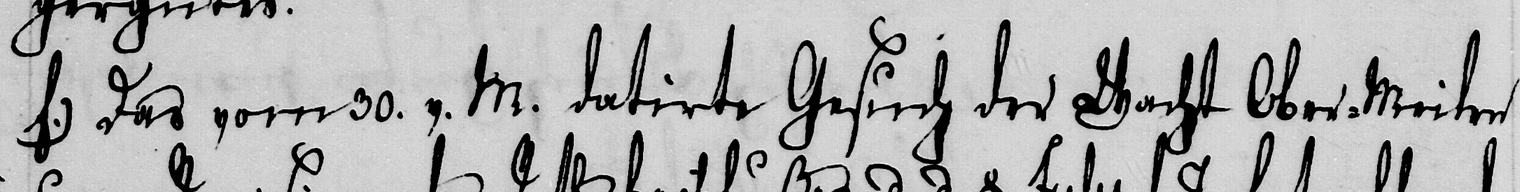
f.) Das vom 30. v. M. datirte Gesuch der Wacht Ober-Meilen
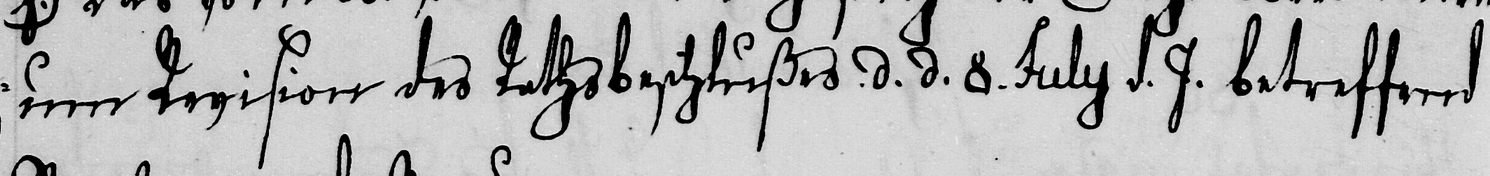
um Revision des Rathsbeschlußes d. d. 8. July d. J. betreffend
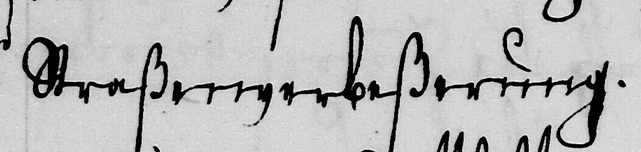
Straßenverbeßerung.
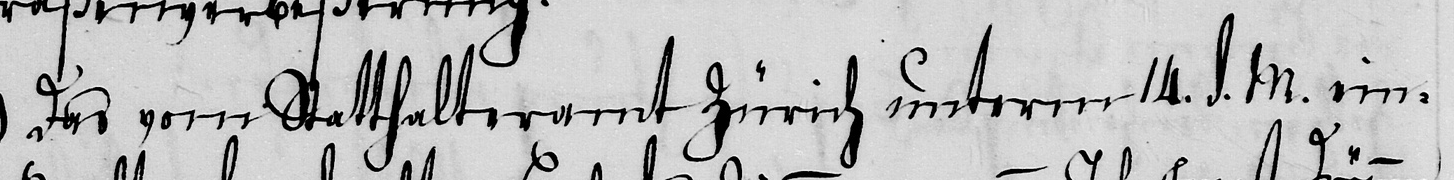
Das vom Statthalteramt Zürich unterm 14. d. M. ein¬
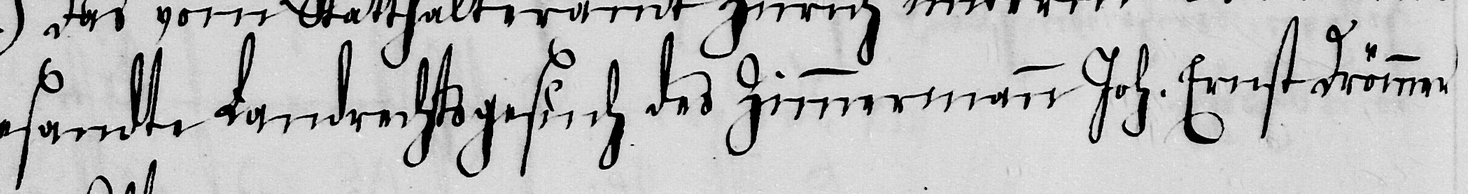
sandte Landrechtsgesuch des Zimmermann Joh. Ernst Dröm¬
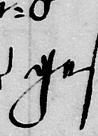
ge¬
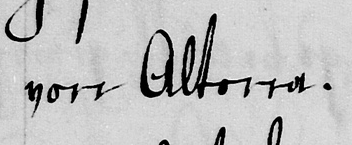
von Altona.
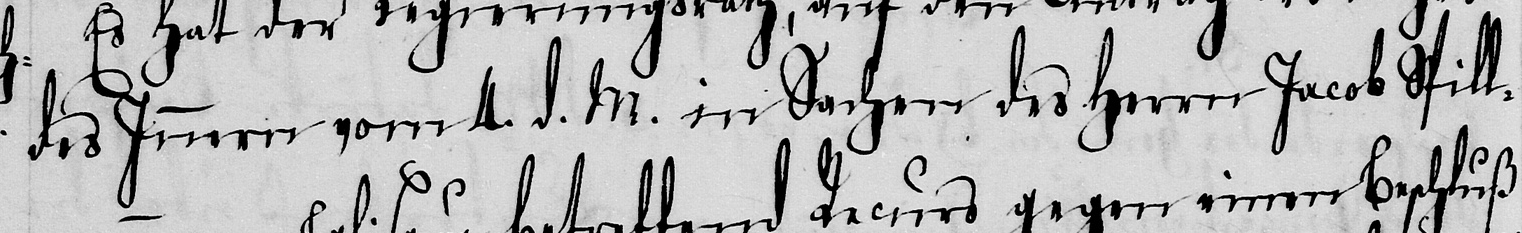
des Innern vom 4. d. M. in Sachen des Herrn Jacob Spil¬
